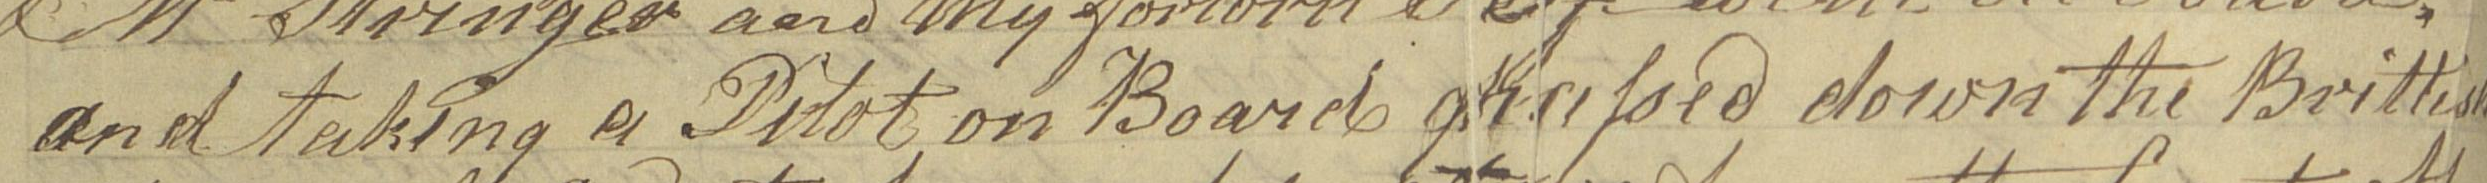and taking a Pilot on Board passed down the Brittish
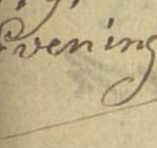-vening
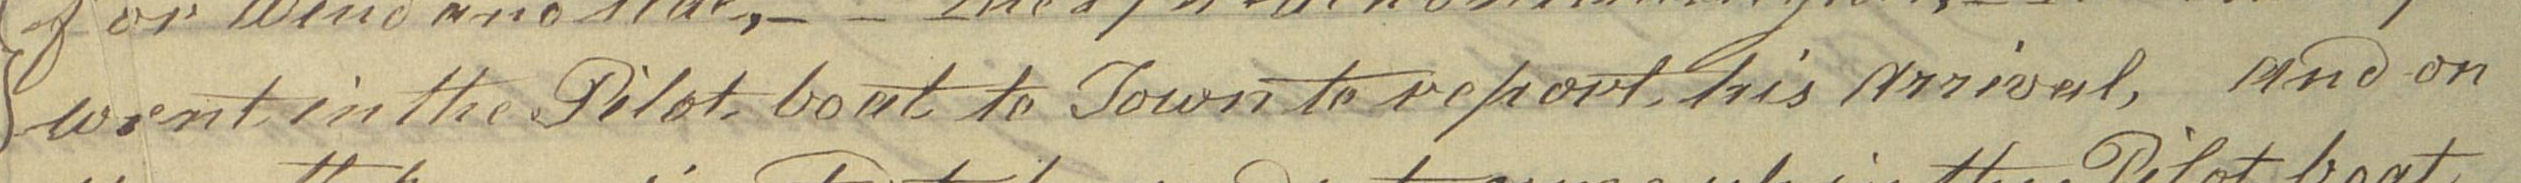went in the Pilot, bout to Town to report his arrival, and on
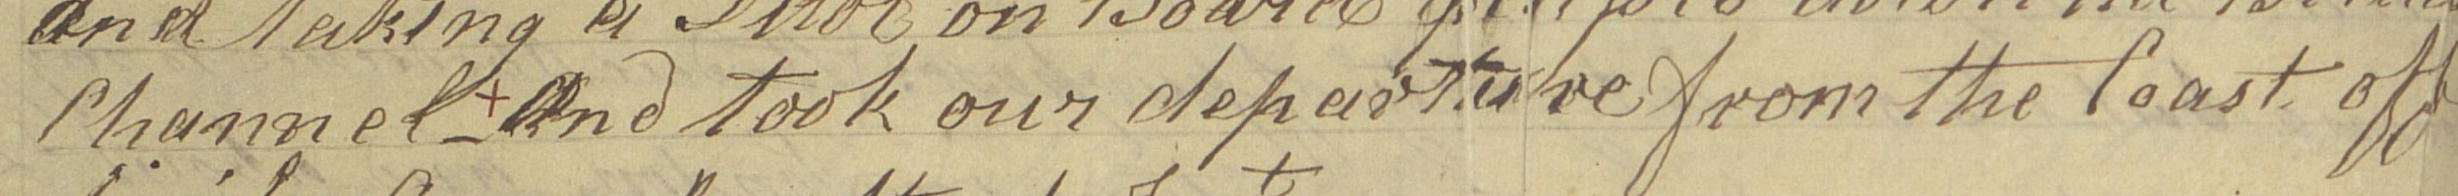Channel And took our departure from the Coast off
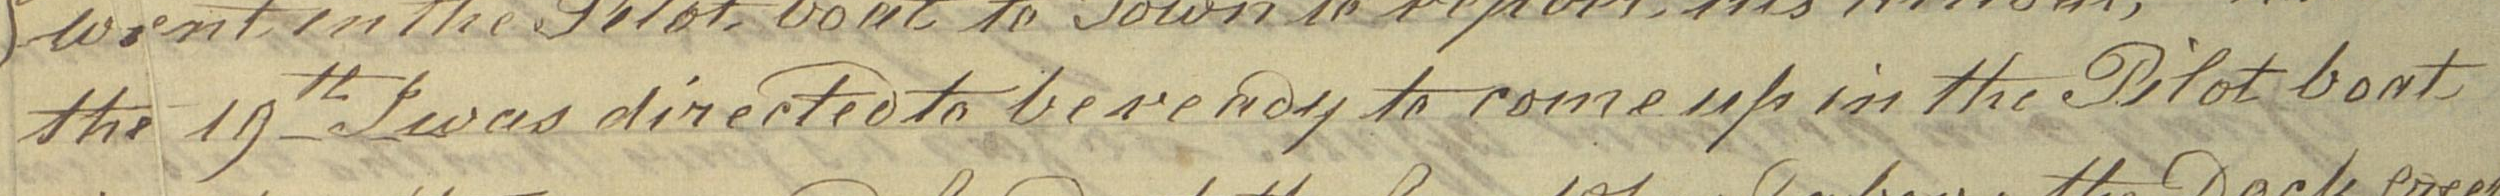the 19^th. I was directed to be ready to come up in the Pilot boat
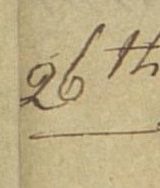26^th
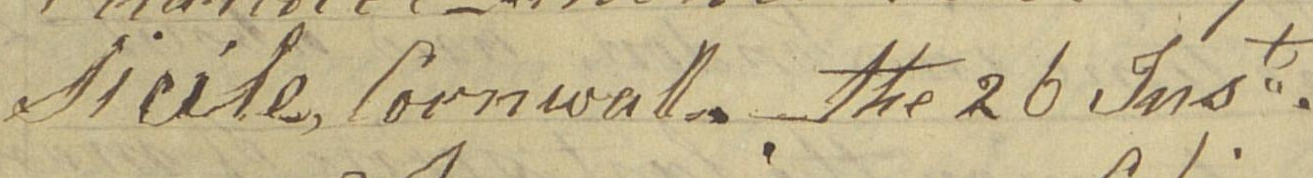Sicile, Cornwal the 26 Ins^t.
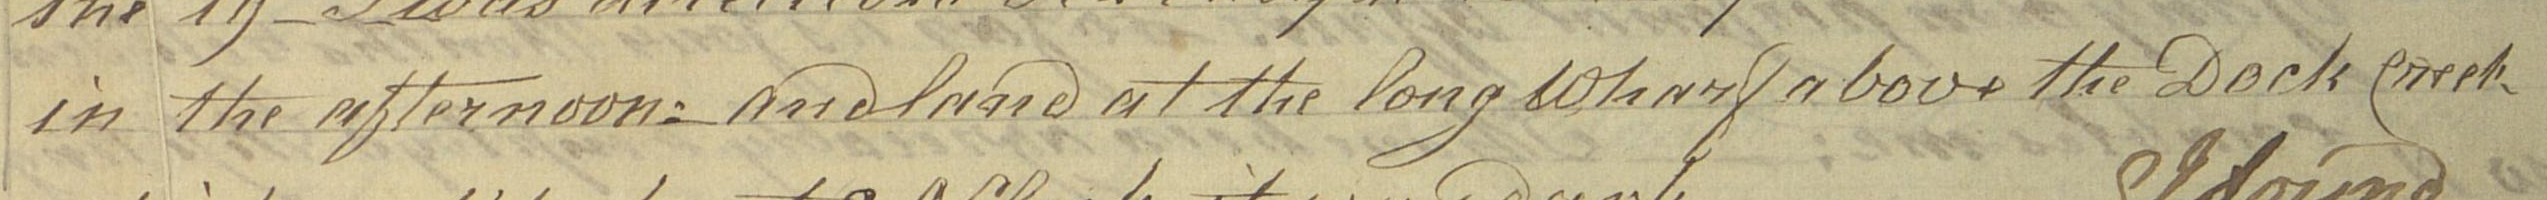in the afternoon: and land at the long Wharf above the Dock Creeck
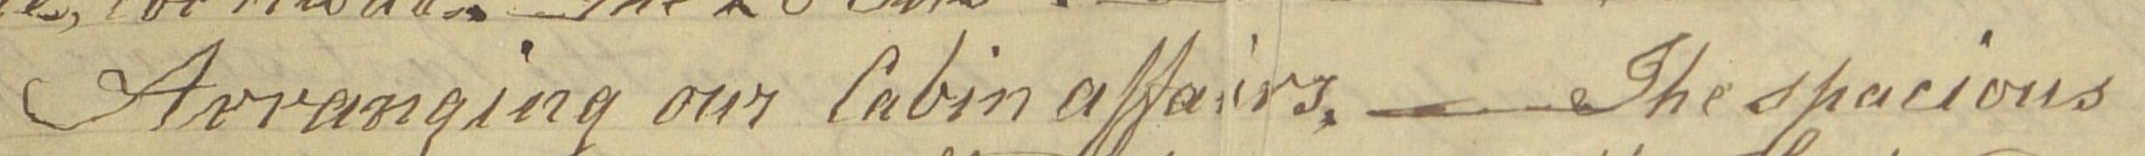Arranging our Cabin affairs,- The spacious
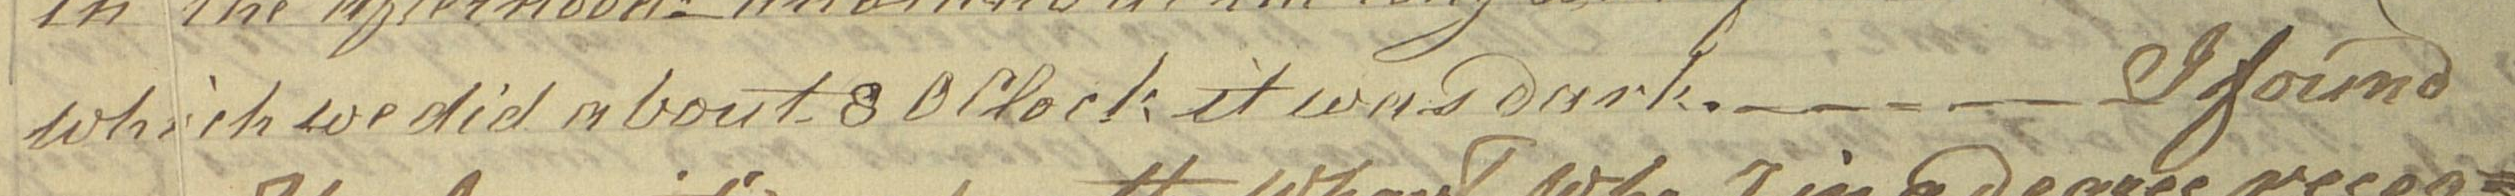which we did about 8 O Clock it was dark. I found
